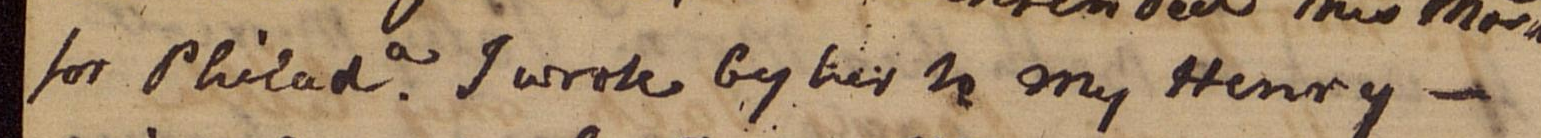for Philad^a. I wrote by her to my Henry-
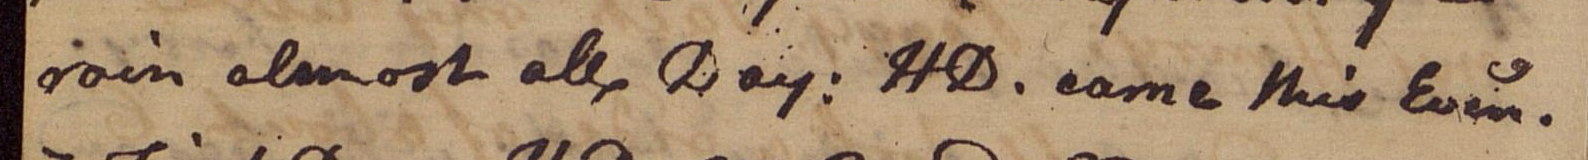rain almost all Day: HD. came this Even^g.
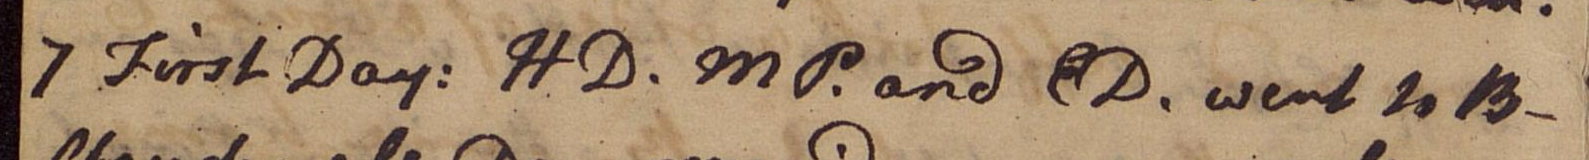7 First Day: H D. MP. and ED. went to B-
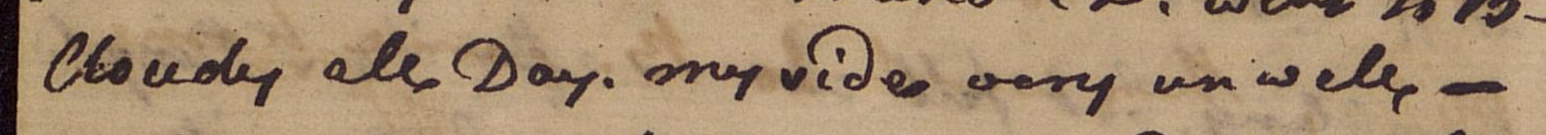Cloudy all Day. my side very unwell-
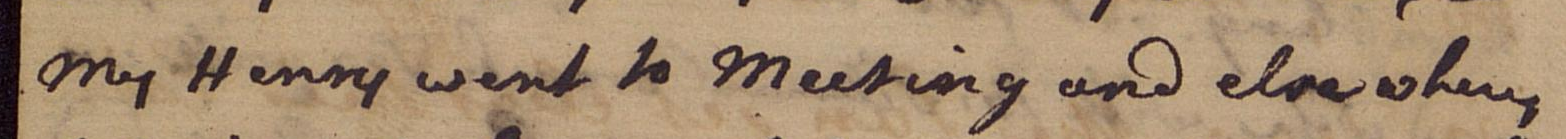my Henry went to Meeting and elsewhere
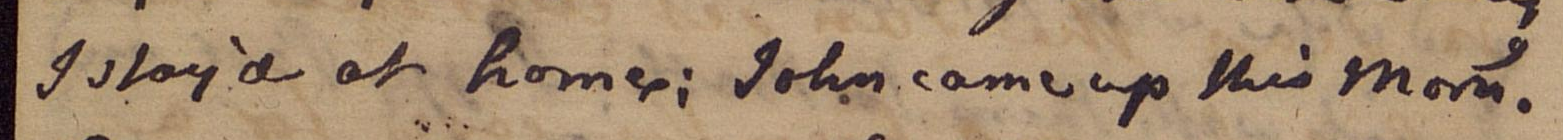I stay'd at home; John came up this Morn^g.
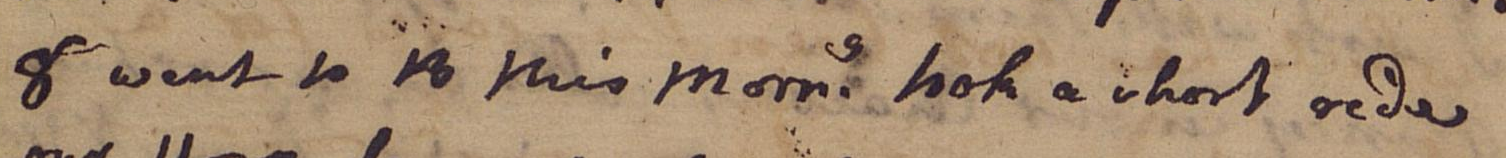8 went to B this morn^g. took a short ride
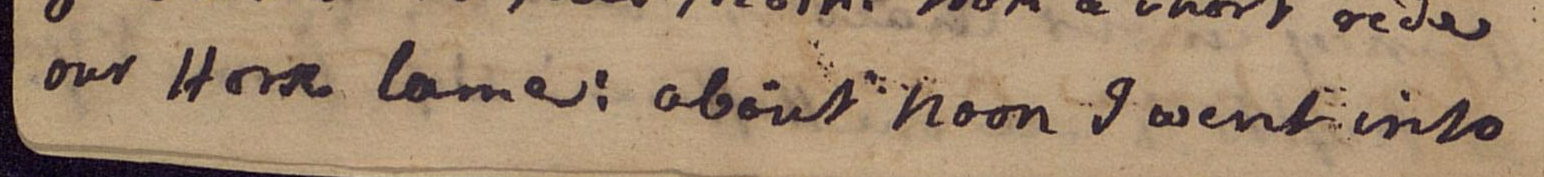our Horse lame: about noon I went into
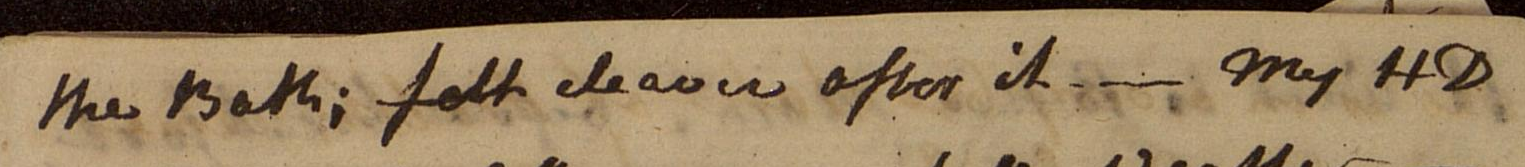the Bath; felt clearer after it.- My HD
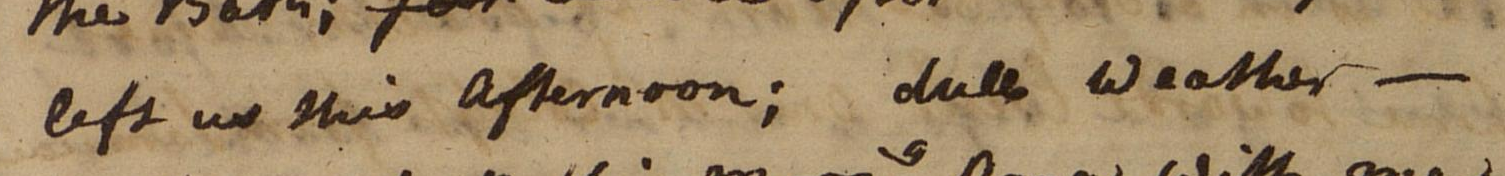left us this Afternoon; dull weather-
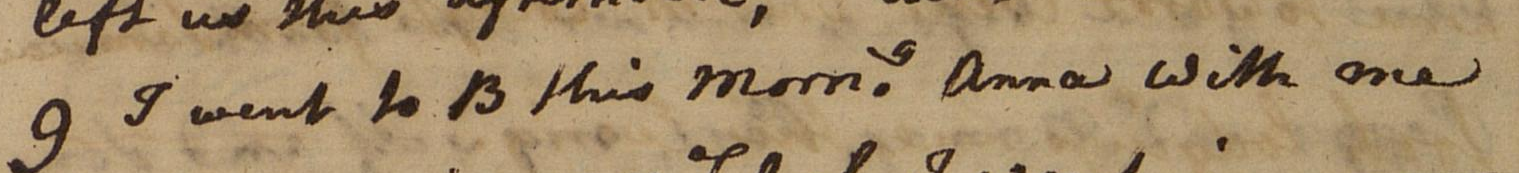9 I went to B this morn^g. Anna with me
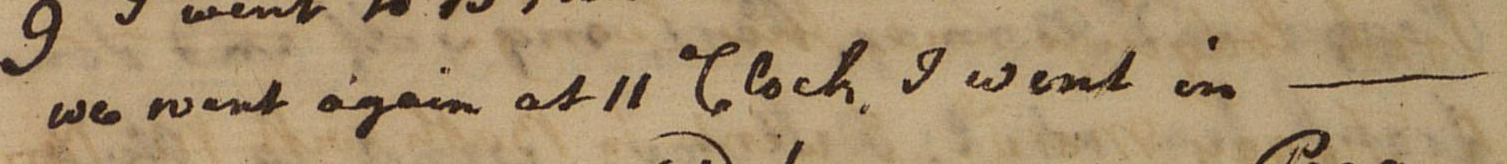we want again at 11 ^o Clock I went in-
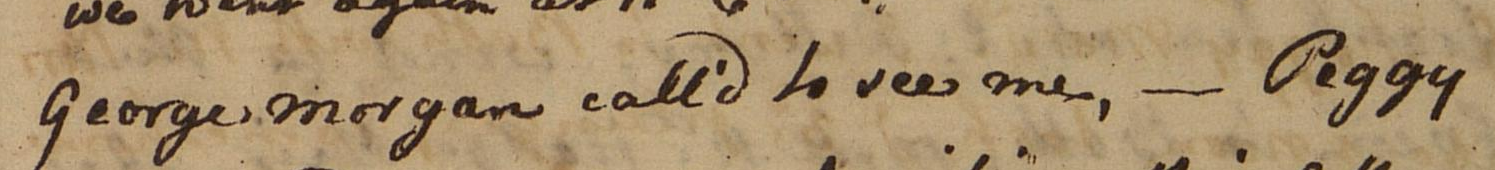George Morgan call'd to see me,- Peggy
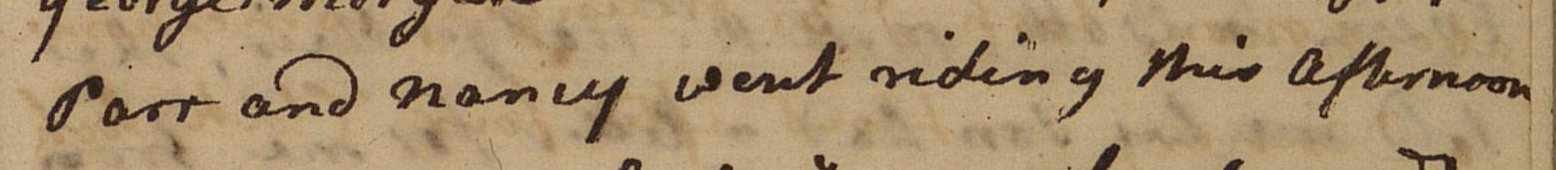Parr and Nancy went riding this Afternoon
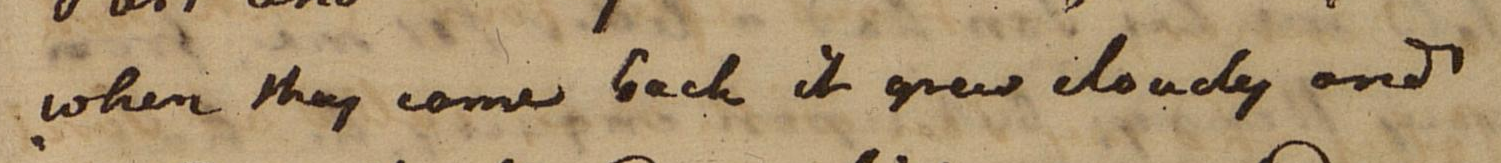when they came back it grew cloudy and
